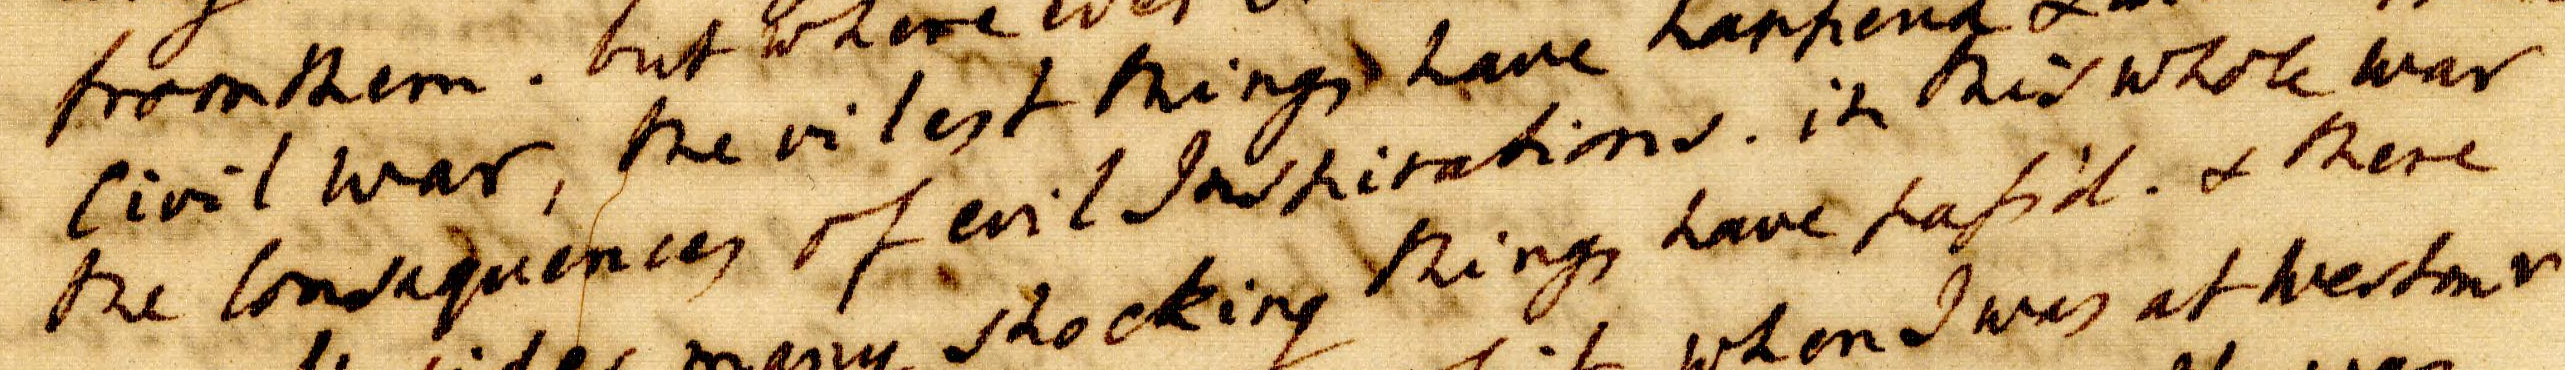the consequences of evil Inspirations. in this whole war
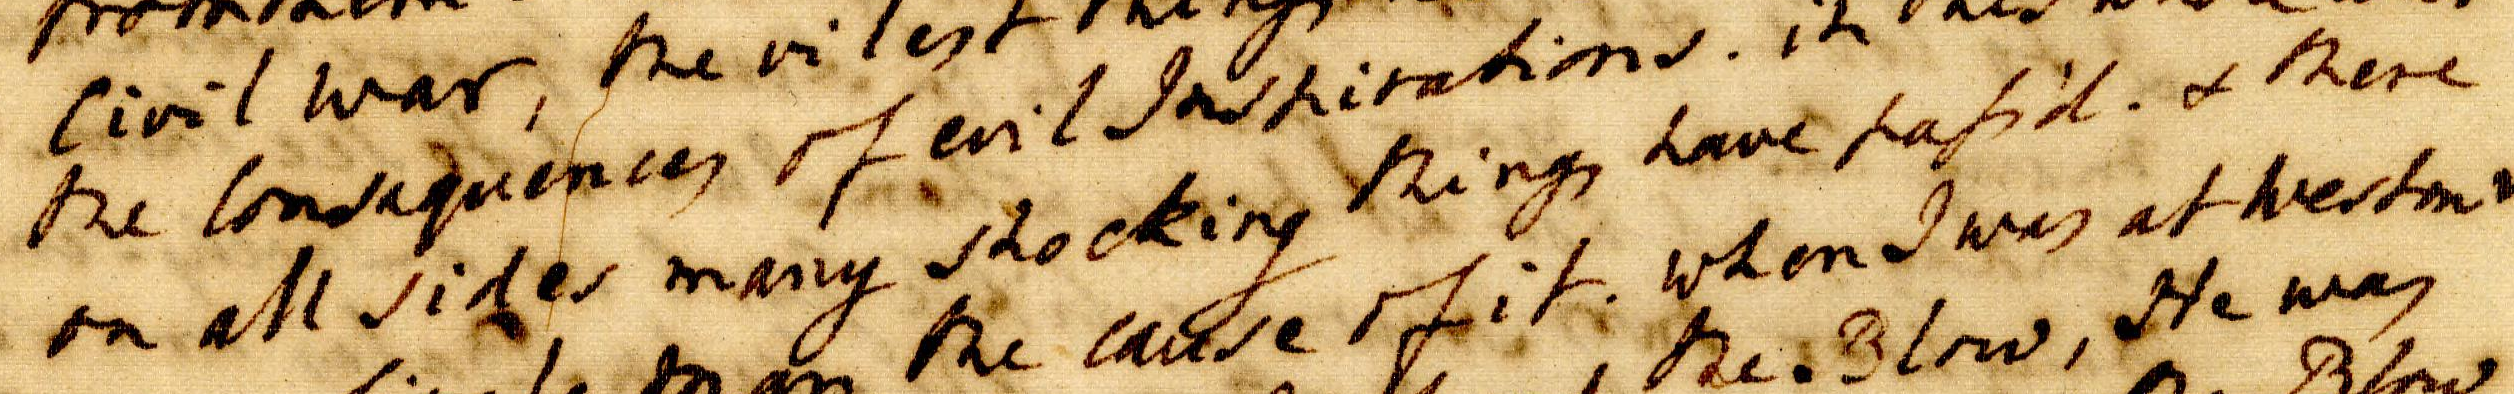on all sides many shocking things have pas'd. & there
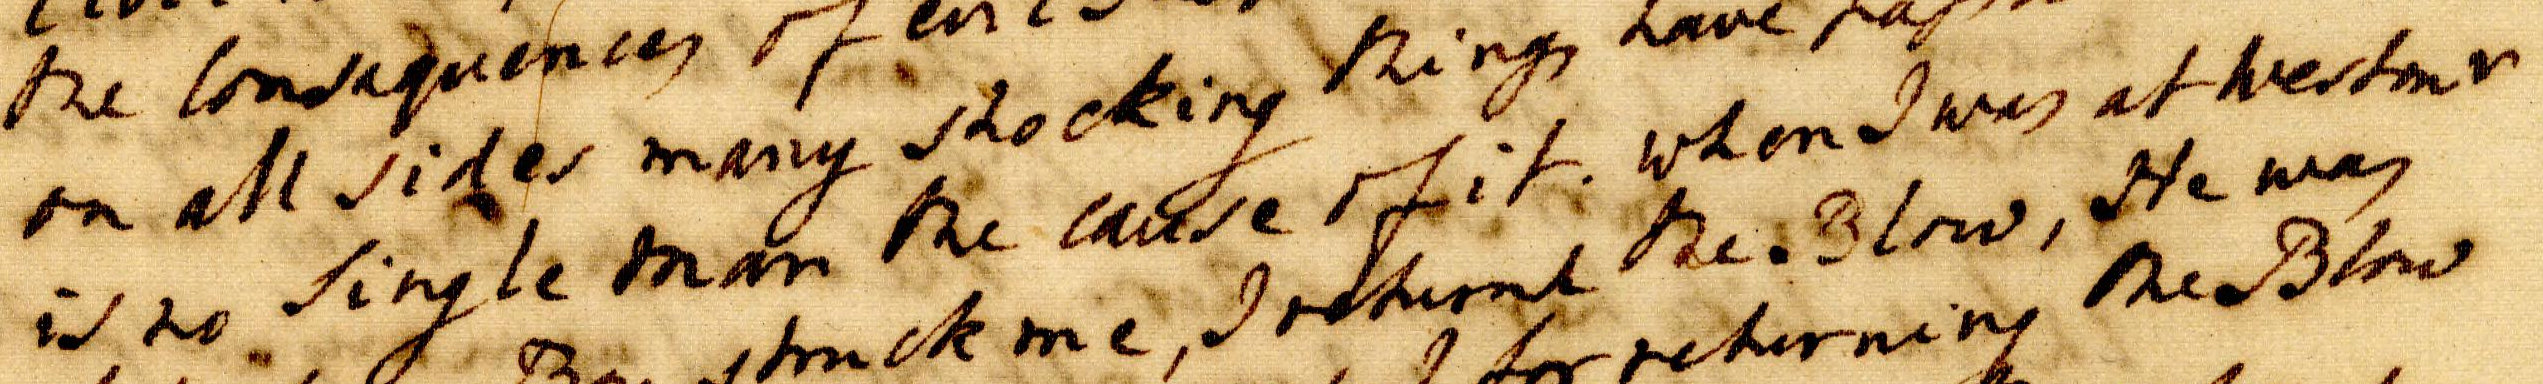is no single man the cause of it. when I was at Westons
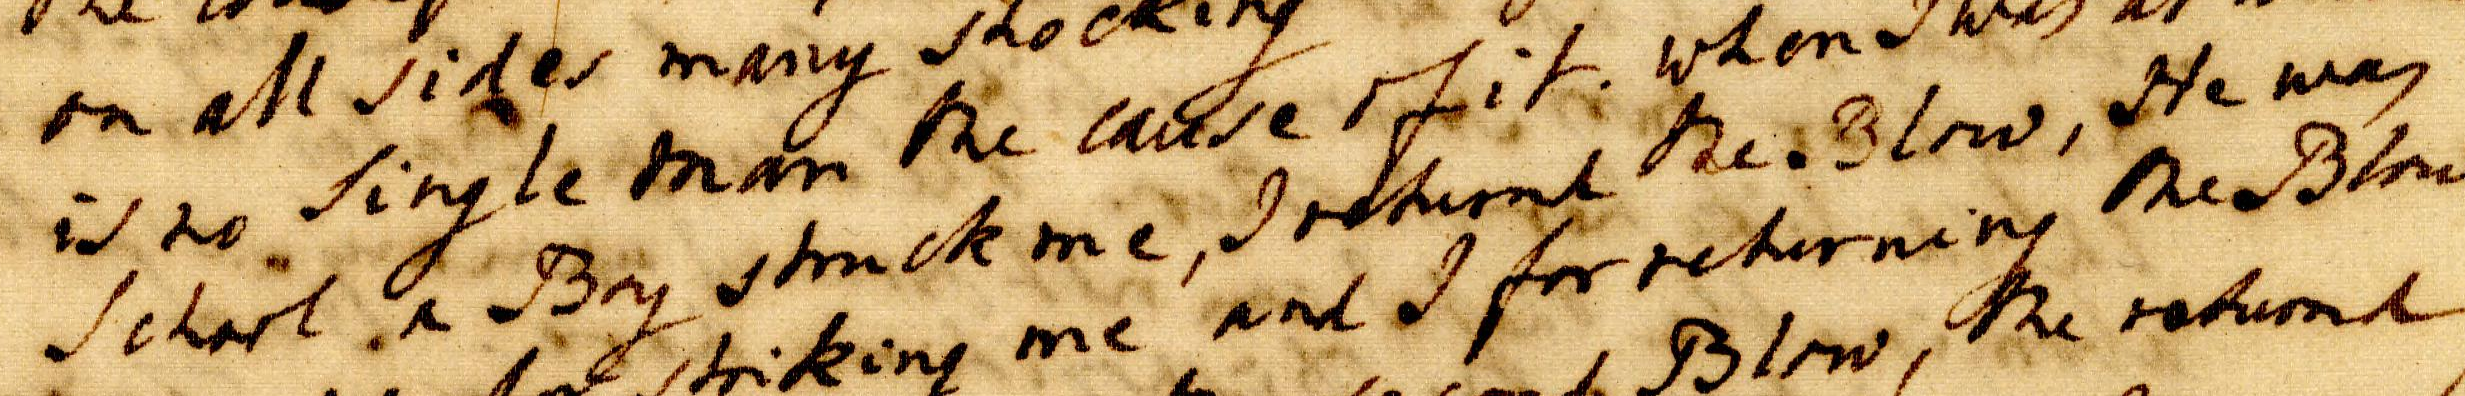School a Boy struck me, I returnd the Blow, He was
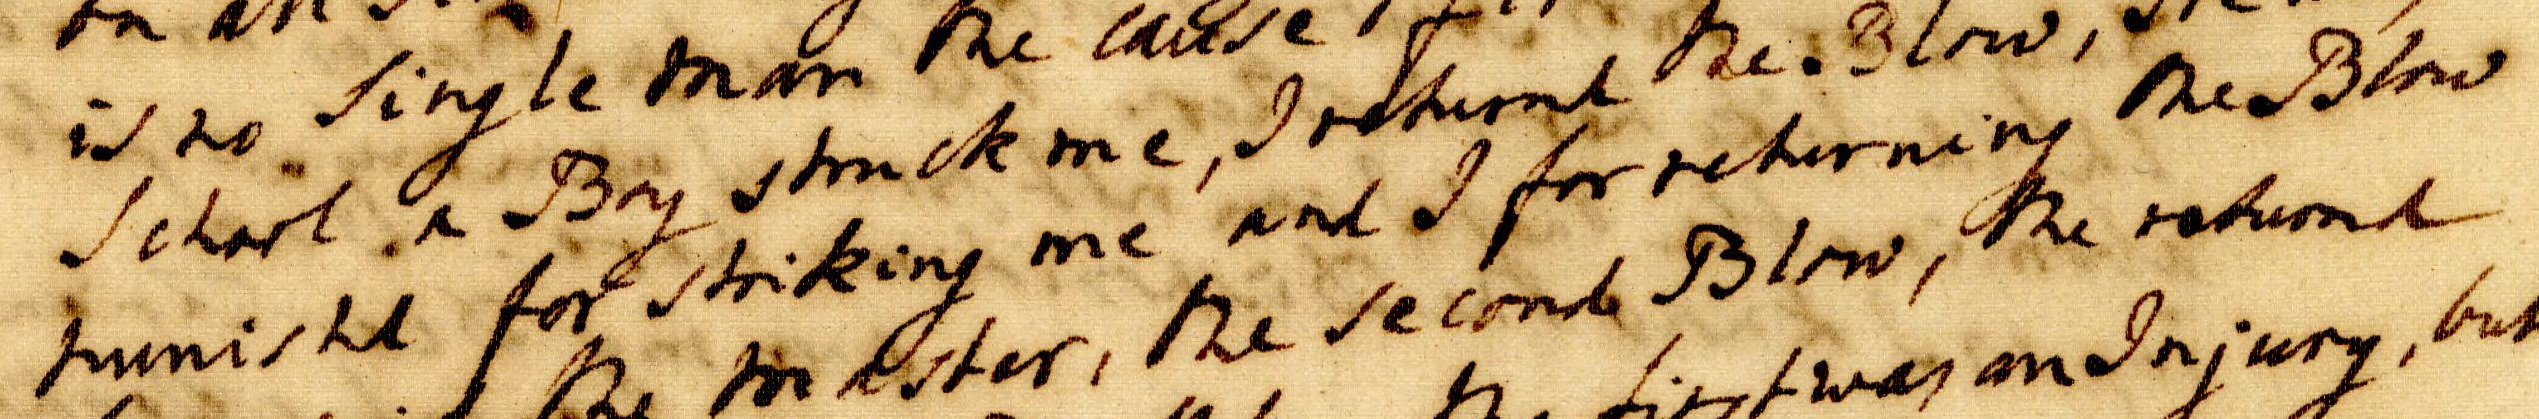punished for striking me and I for returning the Blow
